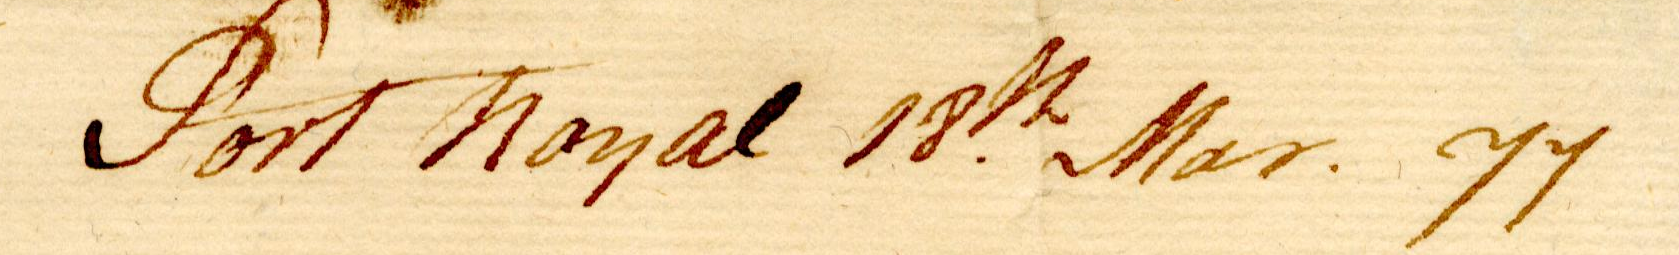Port Royal 18^th Mar 77
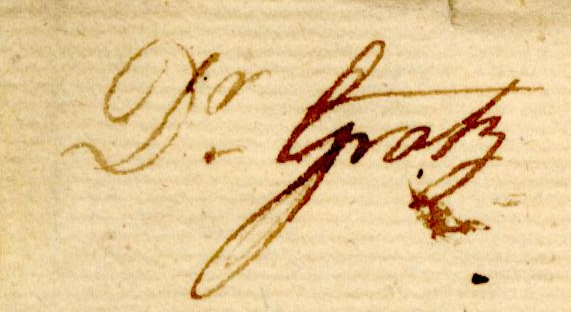D^r. Gratz
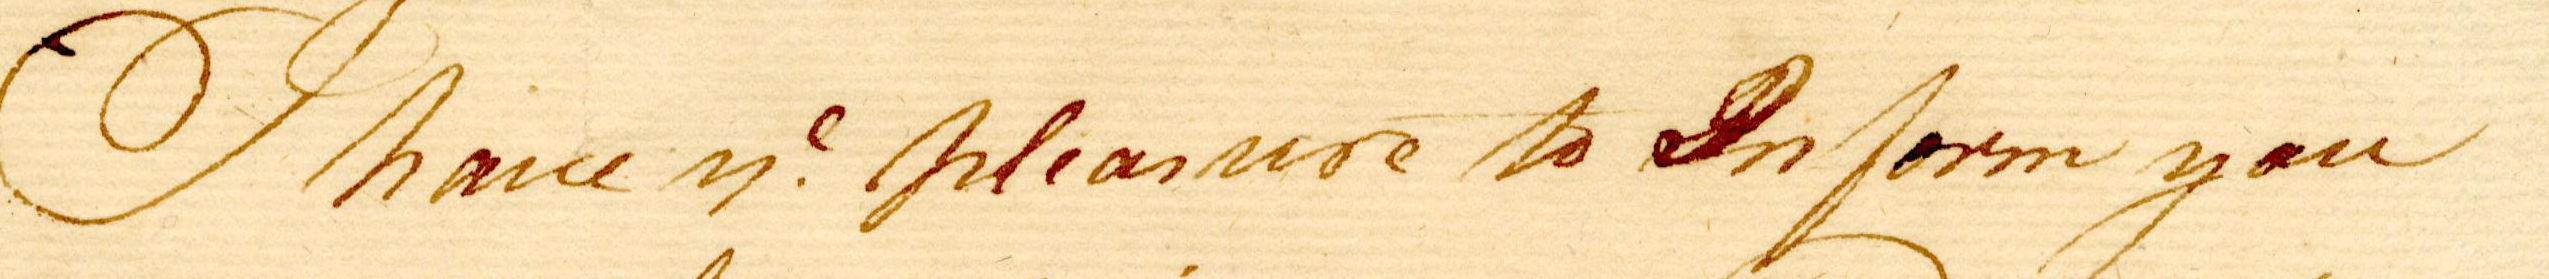I have y^e pleasure to Inform you
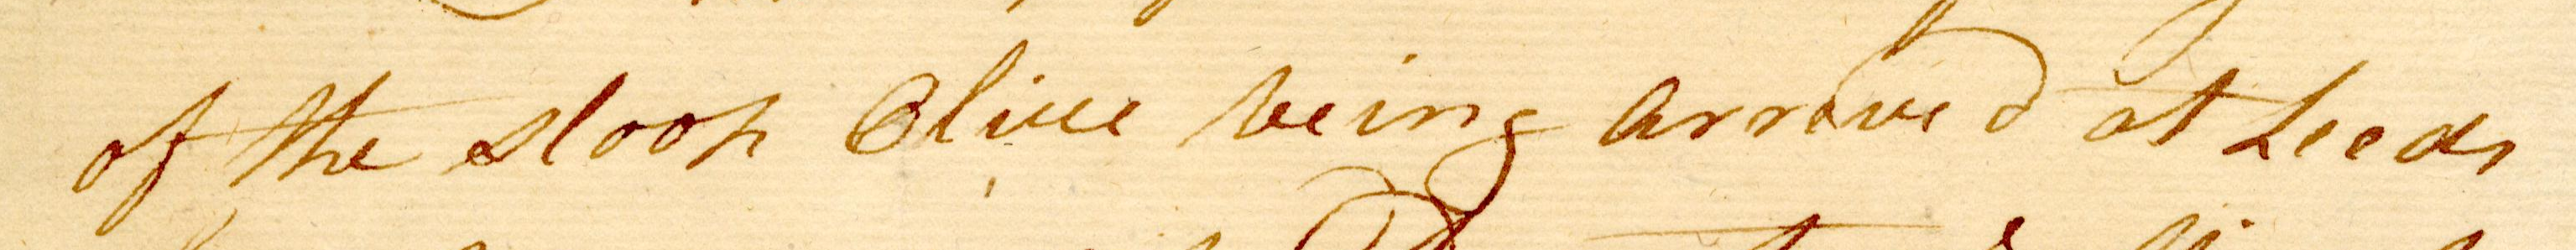of the sloop Olive being arrived at Leeds
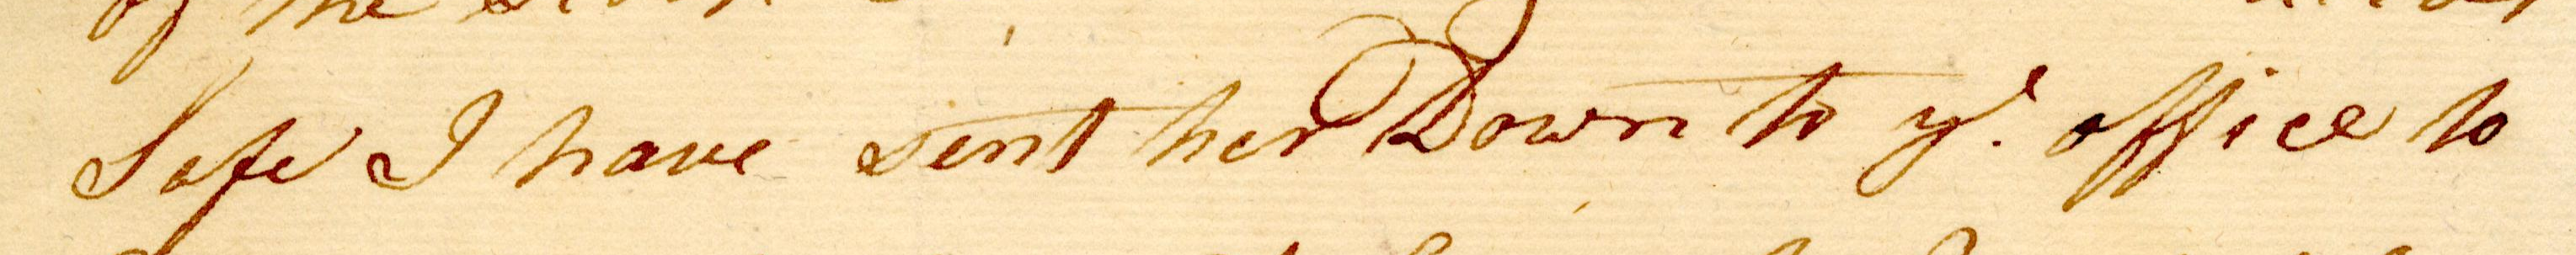Safe I have sent her Down to y^r. office to
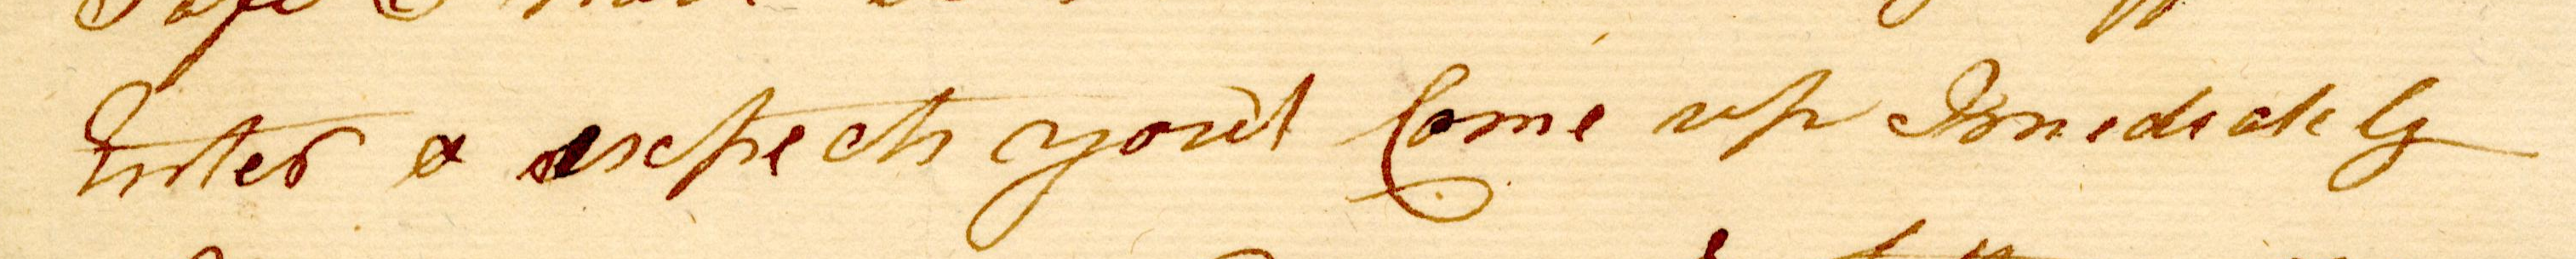Enter & expects you'l Come up Imediately
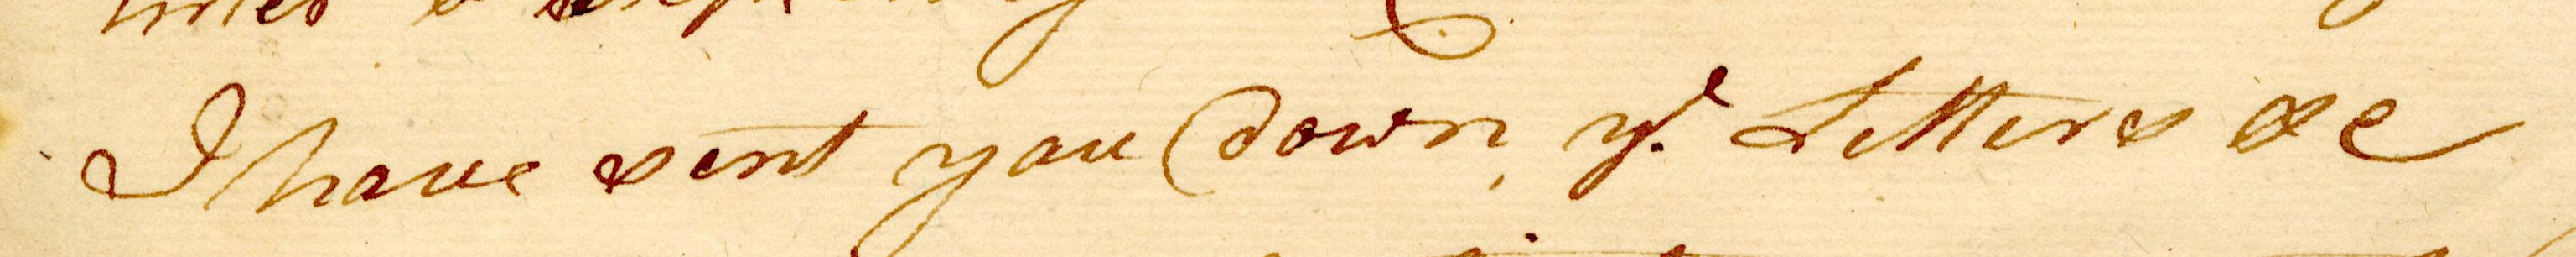I have sent you down y^e. Letters &c
